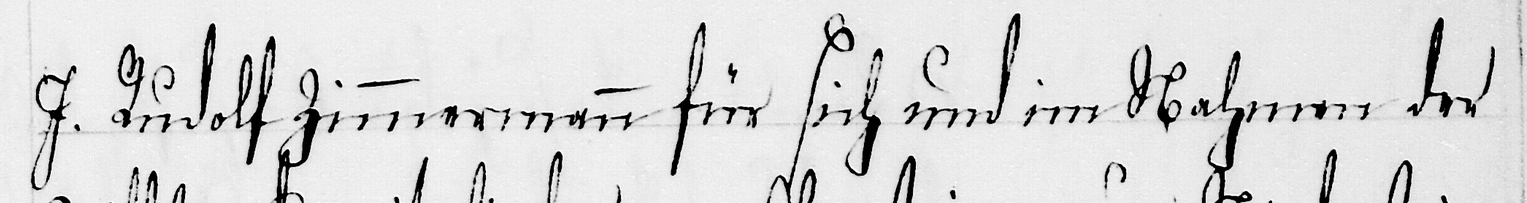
J. Rudolf Zimmermann für sich und im Nahmen der
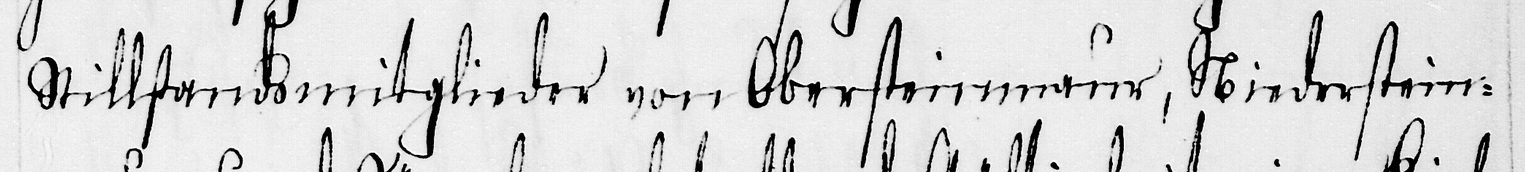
Stillstandsmitglieder von Obersteinmaur, Niederstein¬
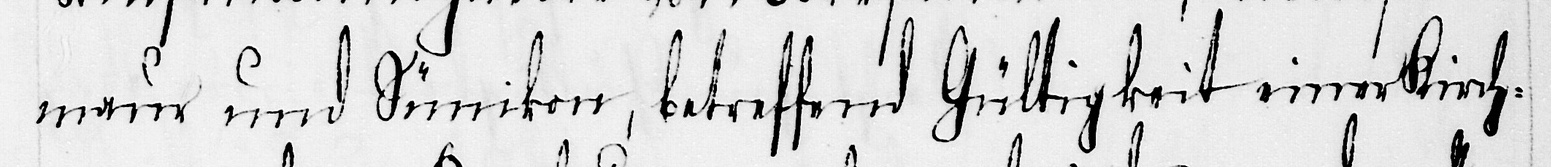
maur und Sünikon, betreffend Gültigkeit einer Kirch¬
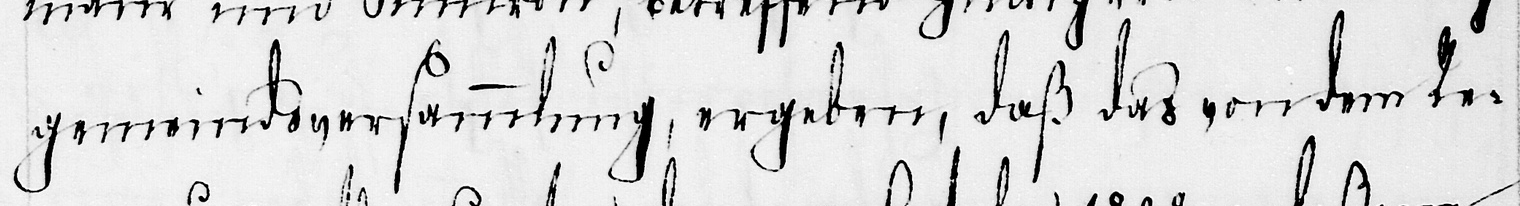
gemeindsversammlung, ergeben, daß das von dem Re¬
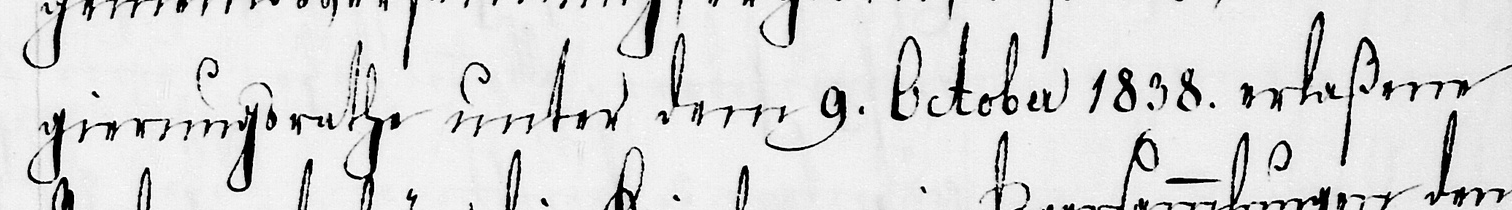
gierungsrathe unter dem 9. October 1838. erlaßene
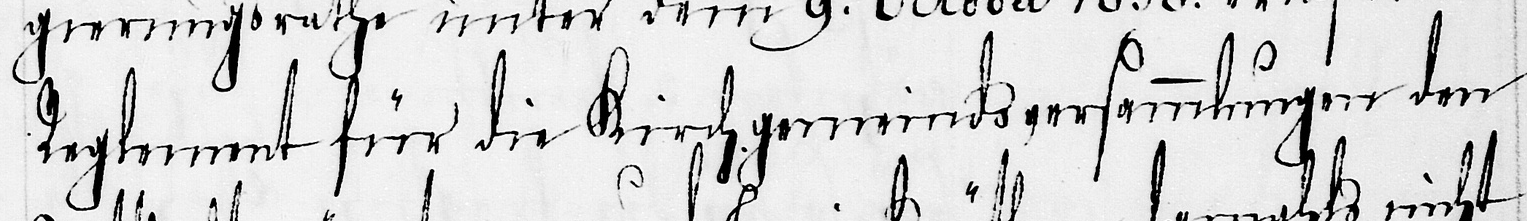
Reglement für die Kirchgemeindsversammlungen den
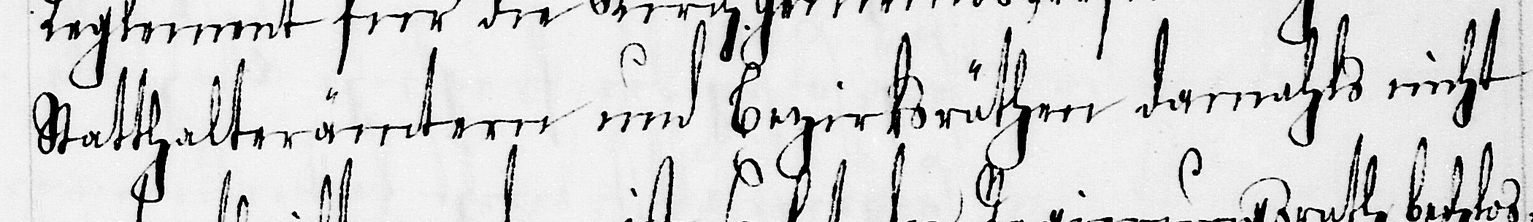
Statthalterämtern und Bezirksräthen damahls nicht
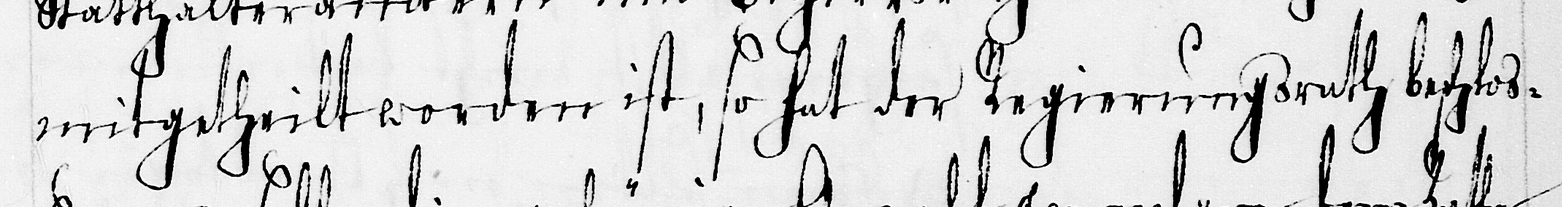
mitgetheilt worden ist, so hat der Regierungsrath beschlo¬
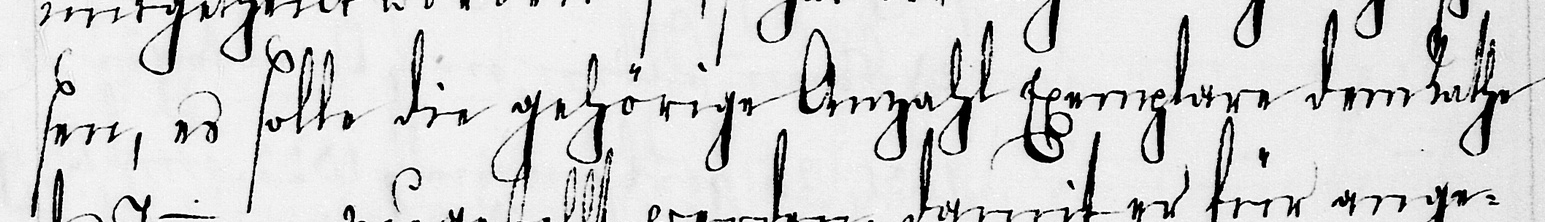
ßen, es solle die gehörige Anzahl Exemplare dem Rathe
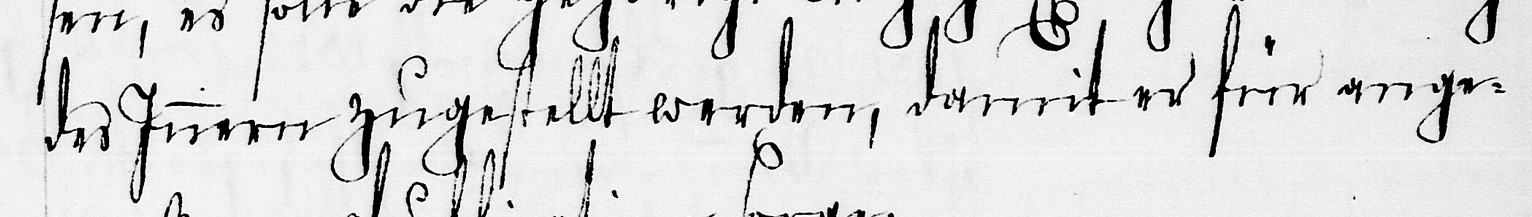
des Innern zugestellt werden, damit er für ange¬
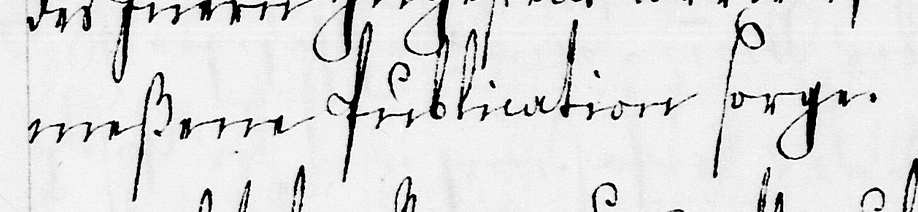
meßene Publication sorge.
